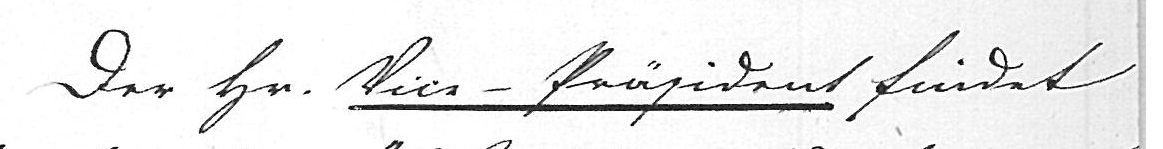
Der Hr. Vice-Präsident findet
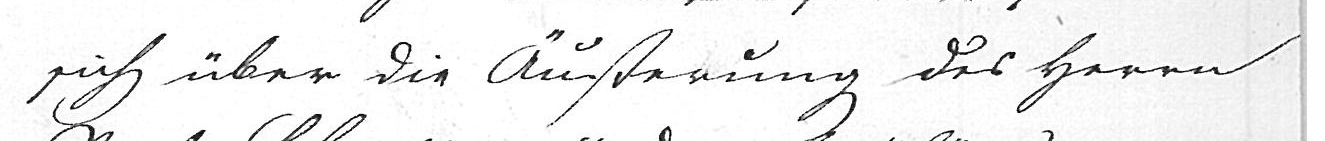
sich über die Äußerung des Herrn
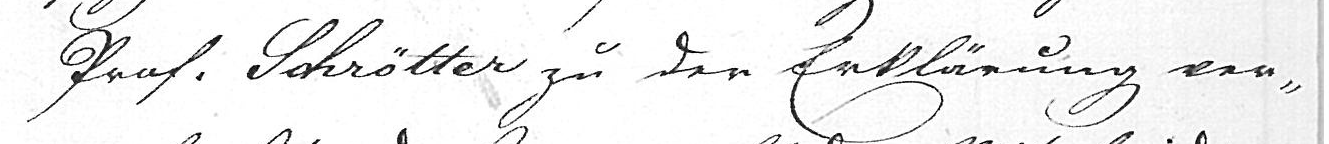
Prof. Schrötter zu der Erklärung ver-
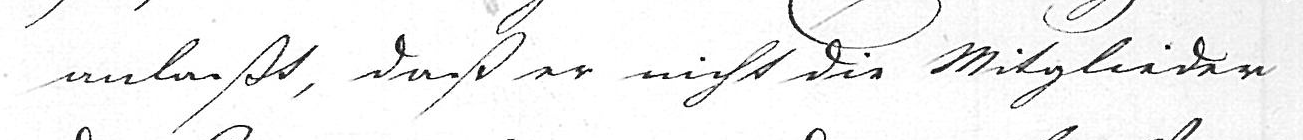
anlaßt, daß er nicht die Mitglieder
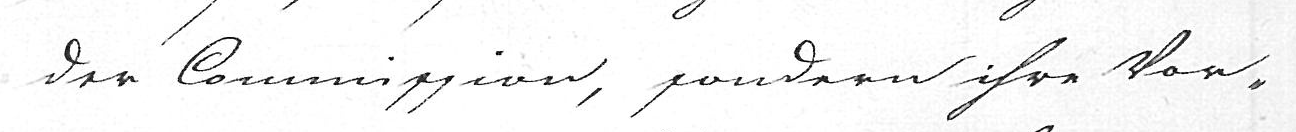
der Commission, sondern ihre Vor-
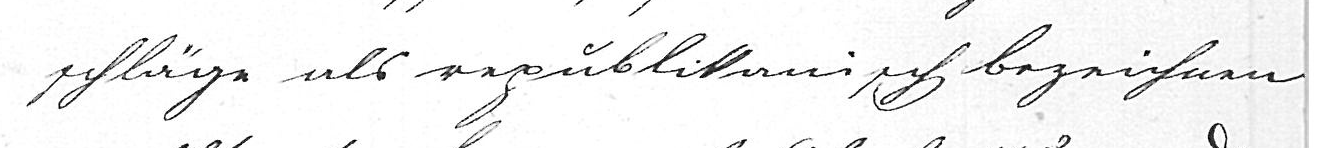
schläge als republikanisch bezeichnen
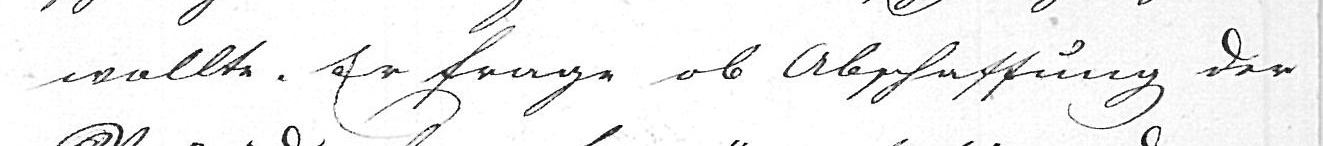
wollte. Er frage ob Abschaffung der
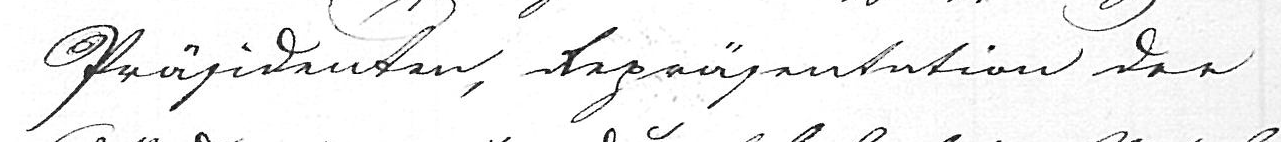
Präsidenten, Repräsentation der
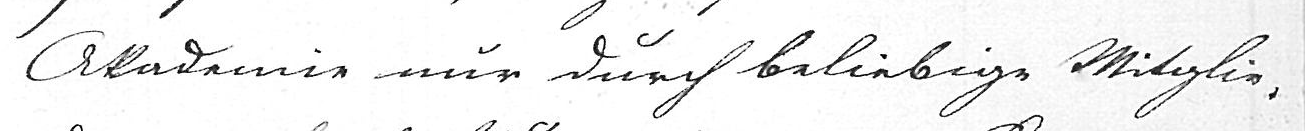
Akademie nur durch beliebige Mitglie-
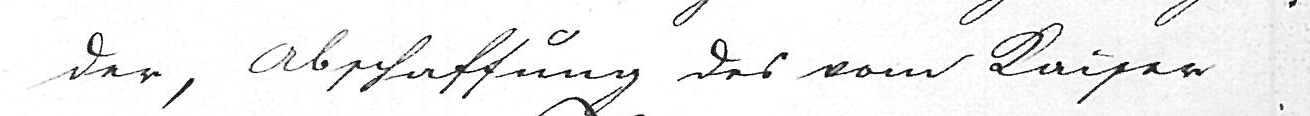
der, Abschaffung des vom Kaiser
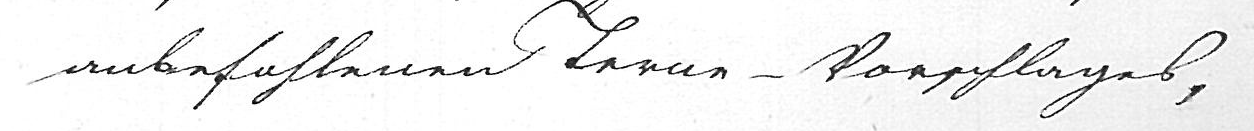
anbefohlenen Terne-Vorschlages,
